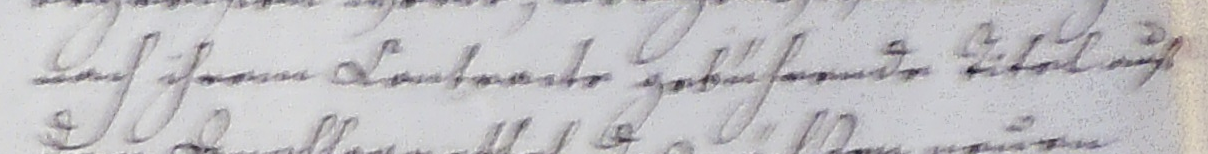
nach ihrem Contracte gehörende Titel auf
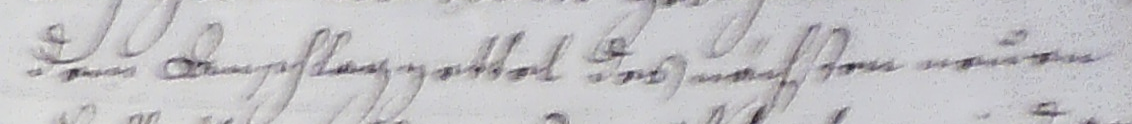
dem Anschlagzettel des nächsten neuen
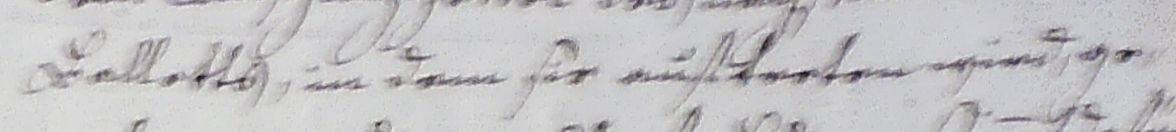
Balletts, an dem sie auftreten wird ge¬
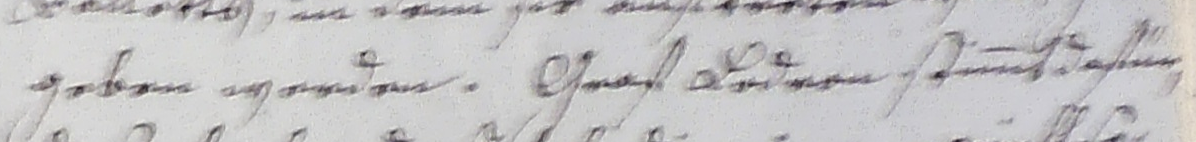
geben werden. Graf Lodron stim̅t dafür
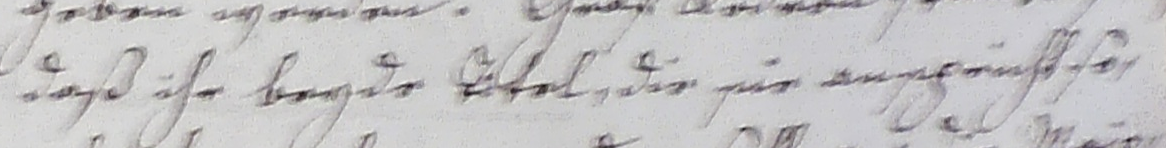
daß ihr beyde Titel, die sie anspricht so¬
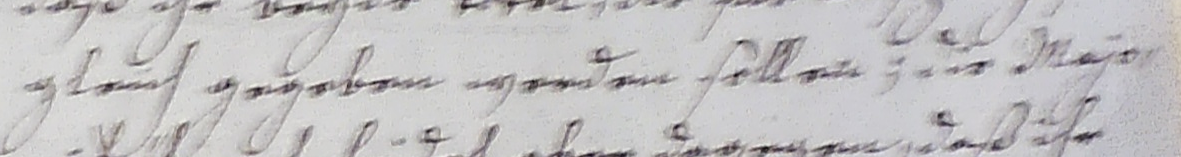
gleich gegeben werden sollen; die Majo¬
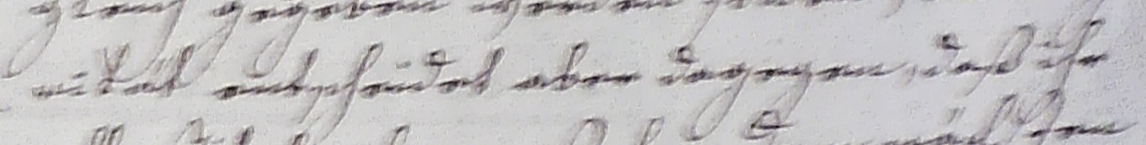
rität entscheidet aber dagegen daß ihr
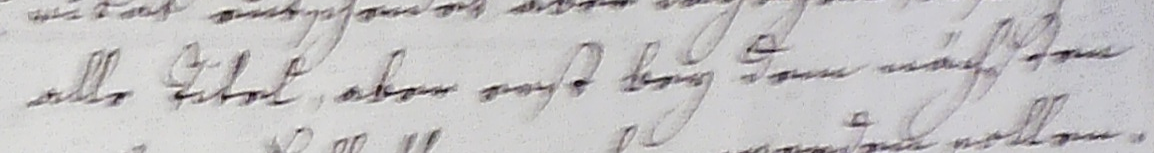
alle Titel, aber erst bey demnächsten
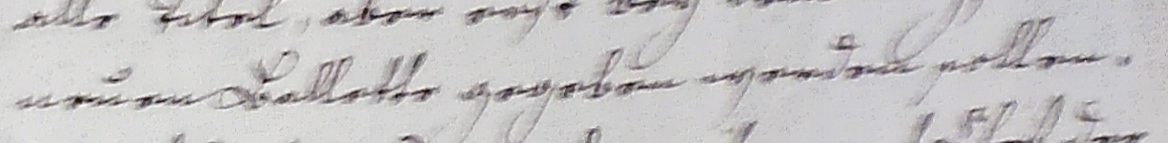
neuen Ballette gegeben werden sollen.
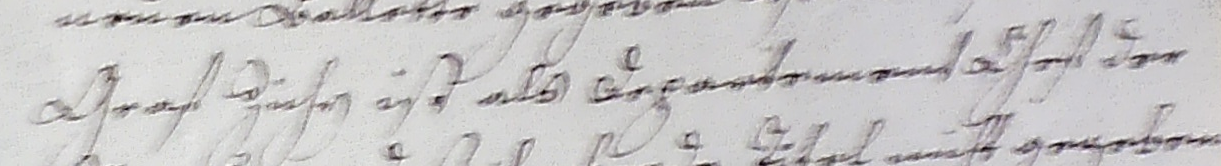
Graf Zichy ist als Department Chef der
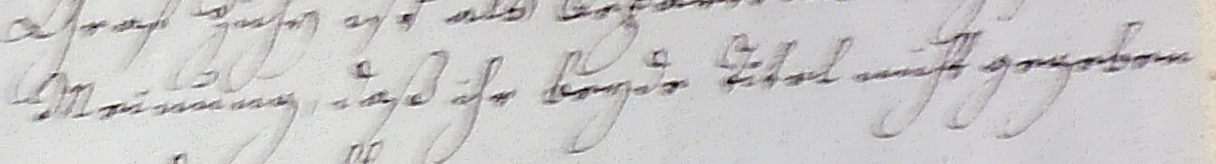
Meinung, daß ihr beyde Titel nicht gegeben
